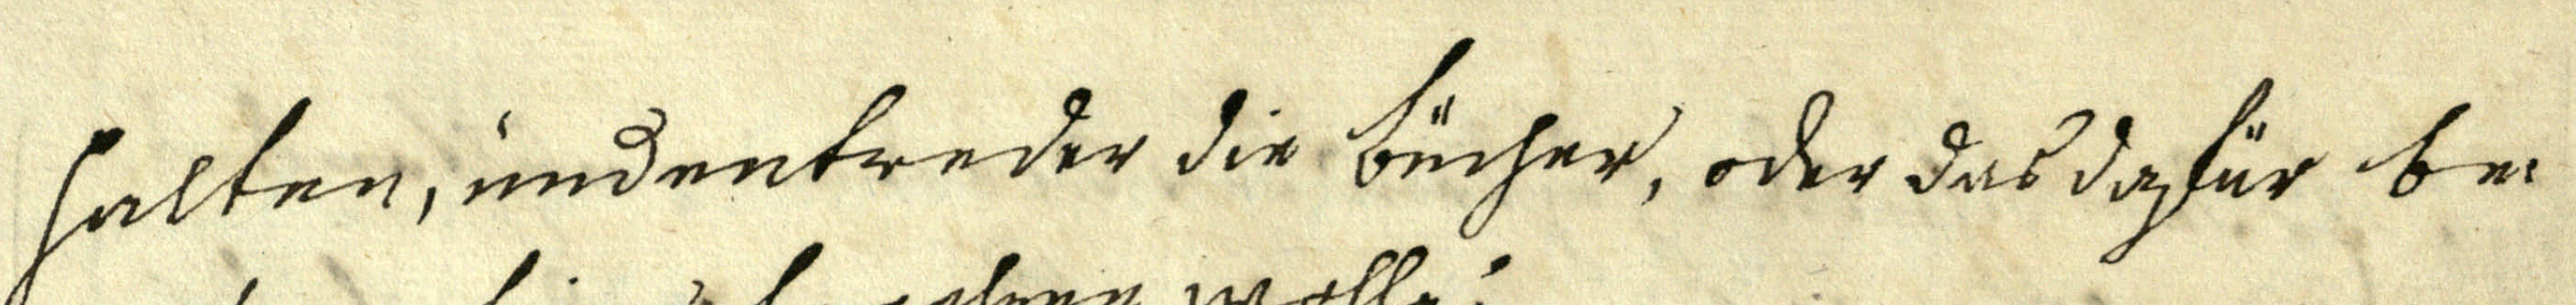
halten, undentweder die Bücher, oder das dafür be¬
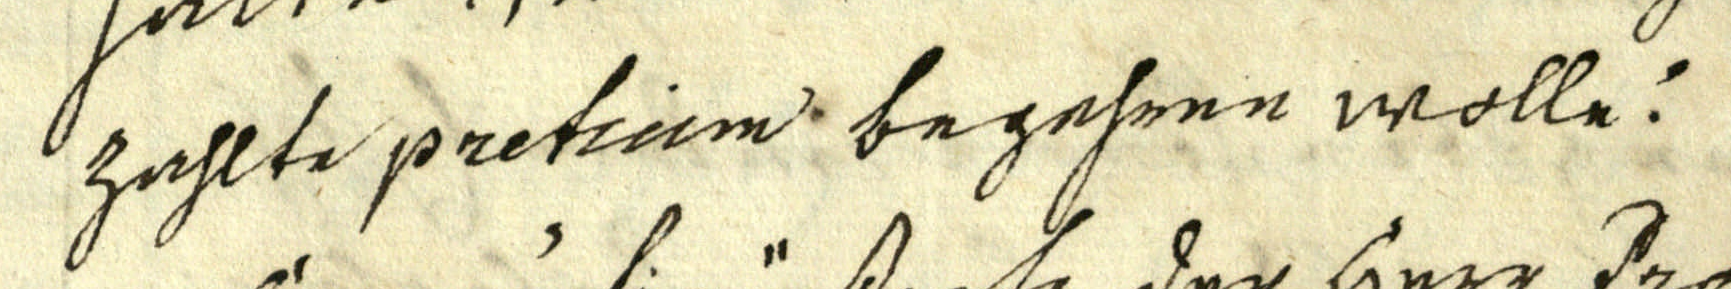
zahlte pretium begehren wolle?
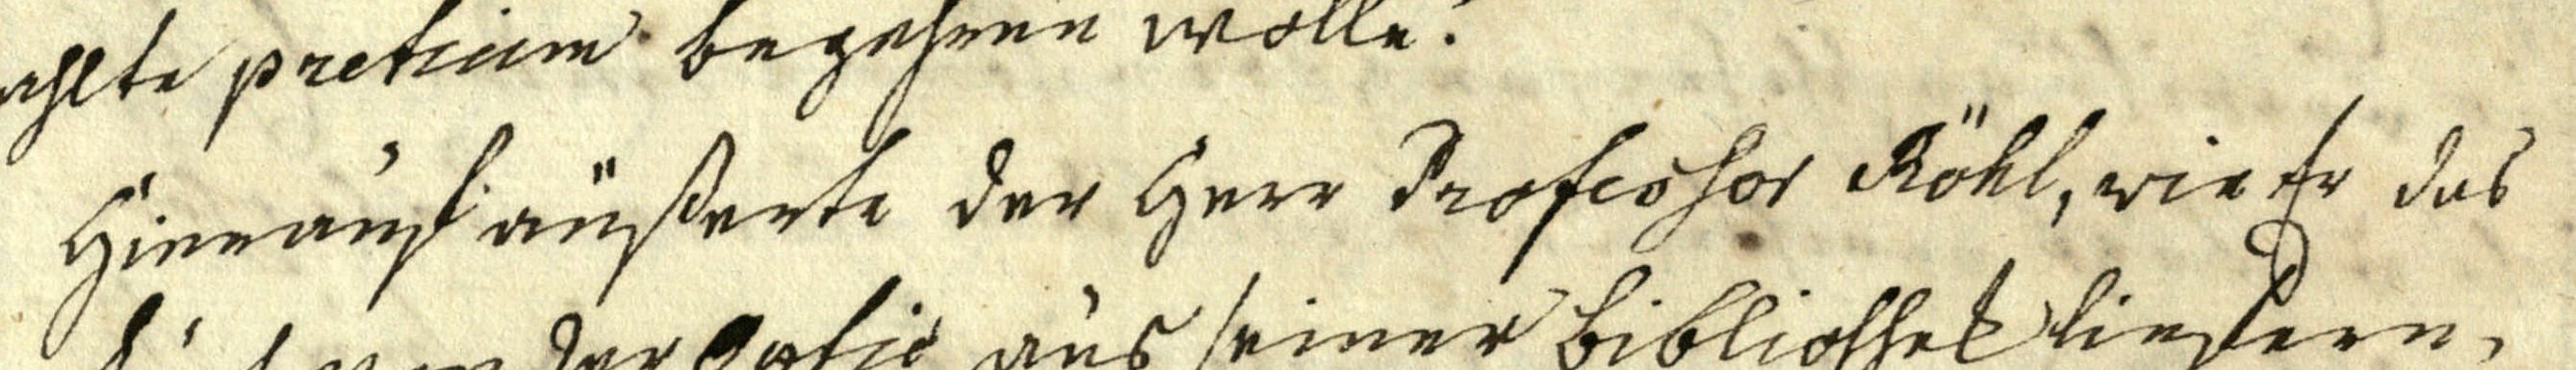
Hierauf äußerte der Herr Professor Röhl, wie Er das
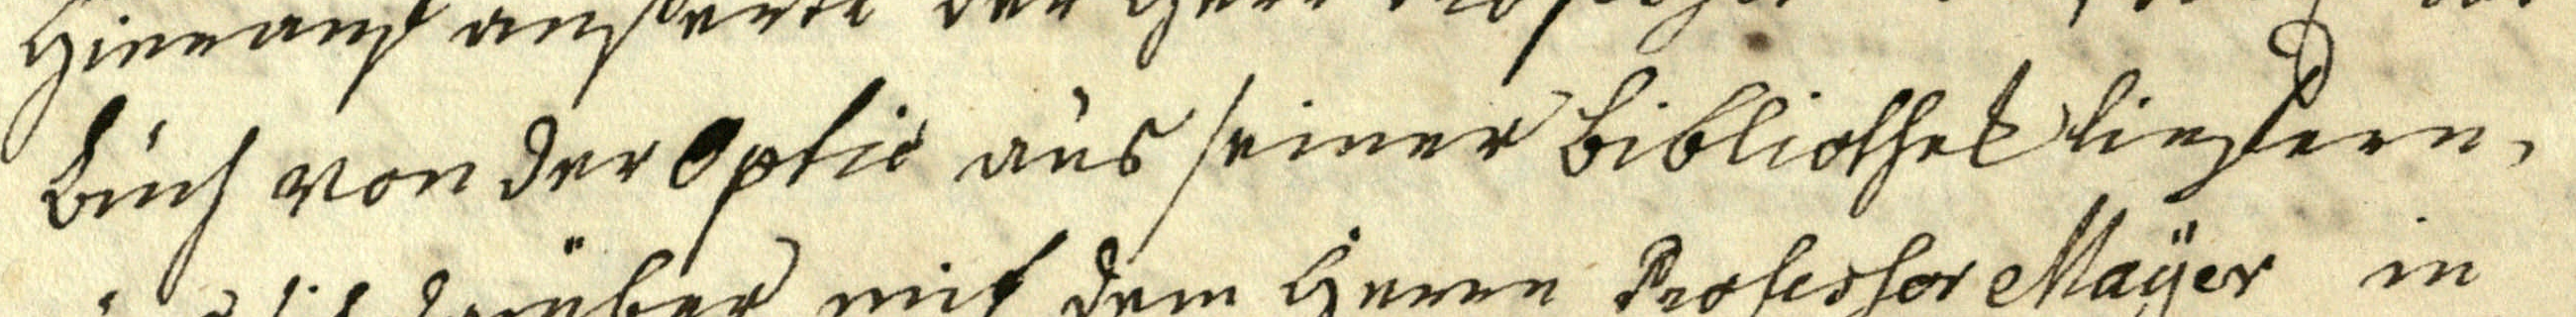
Buch von der Optic aus seiner Bibliothek liefern
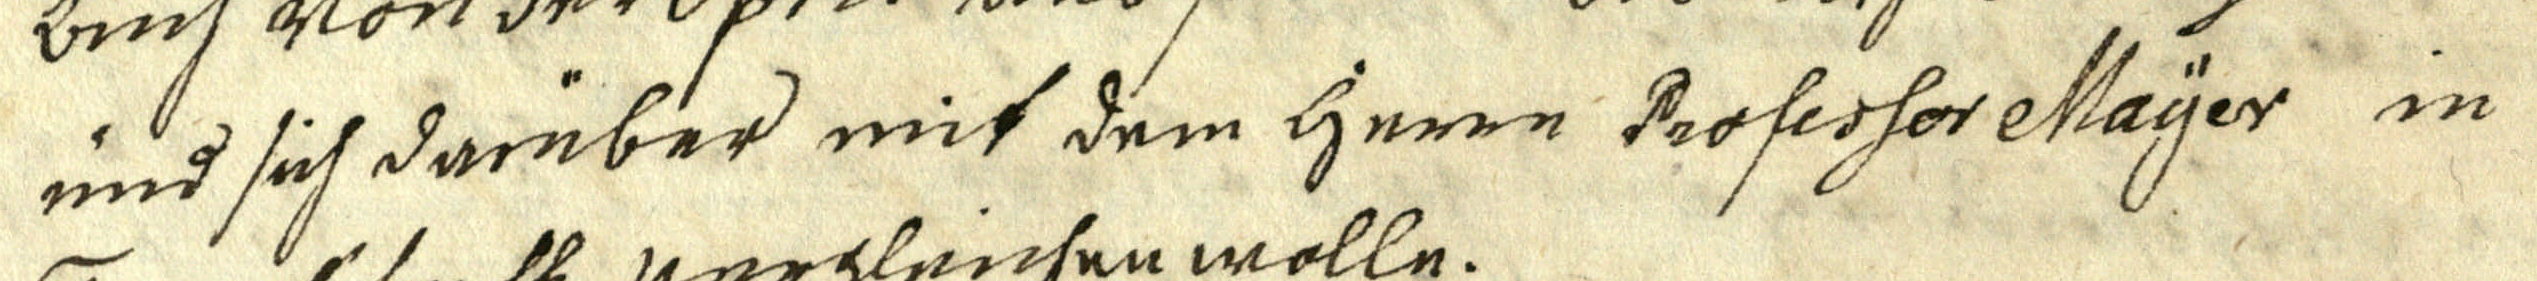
und sich darüber mit dem Herrn Professor Maÿer in
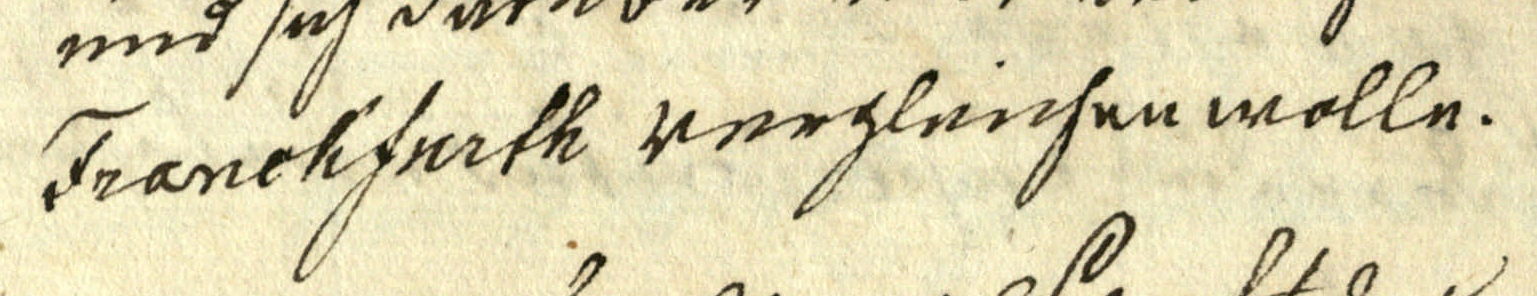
Franckfurth vergleichen wolle.
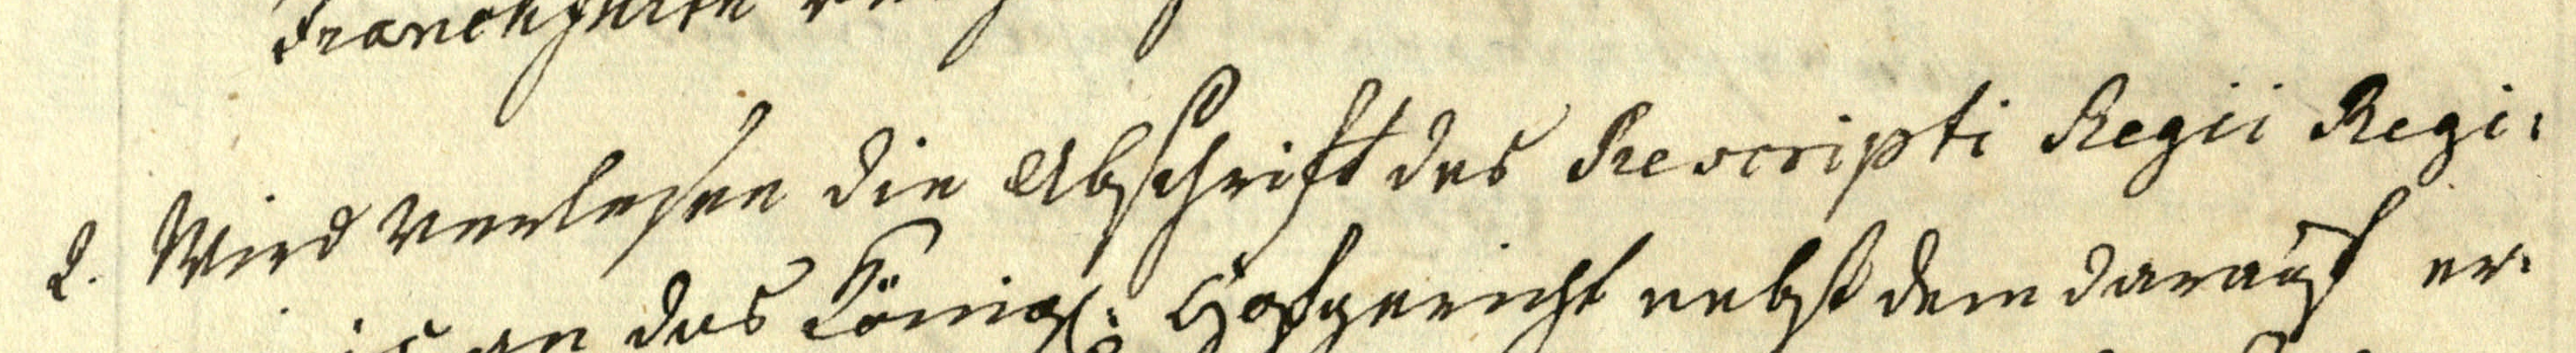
2. Wird verlesen die Abschrift des Rescripti Regii Regi¬
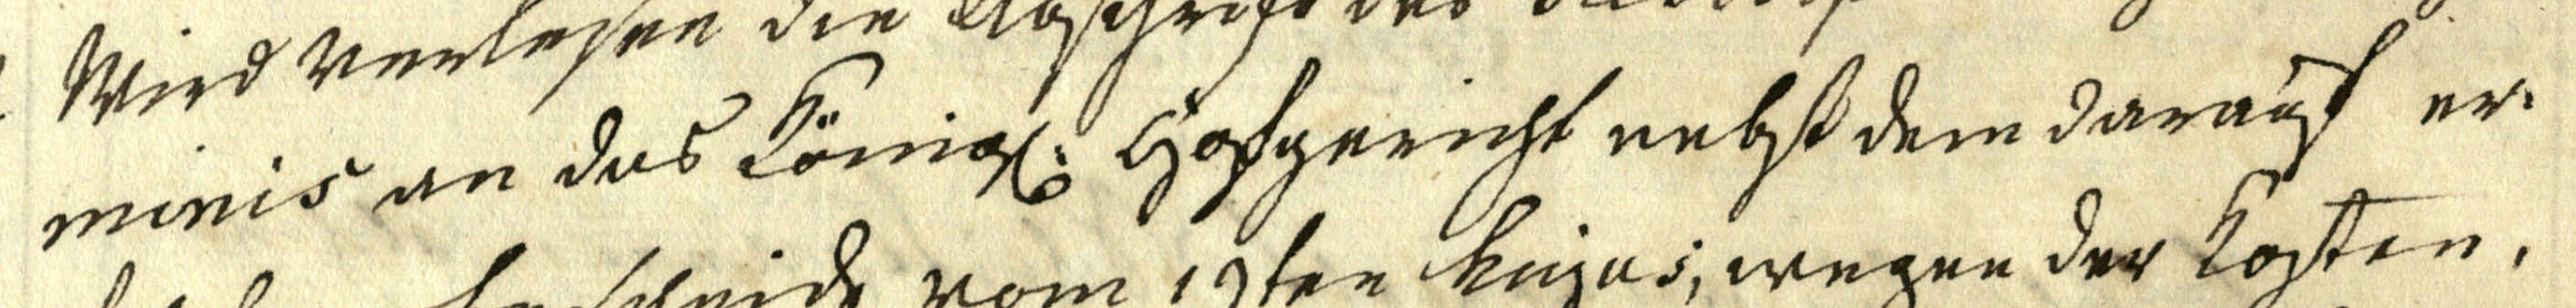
minis an das Königl. Hofgericht nebst dem darauf er¬
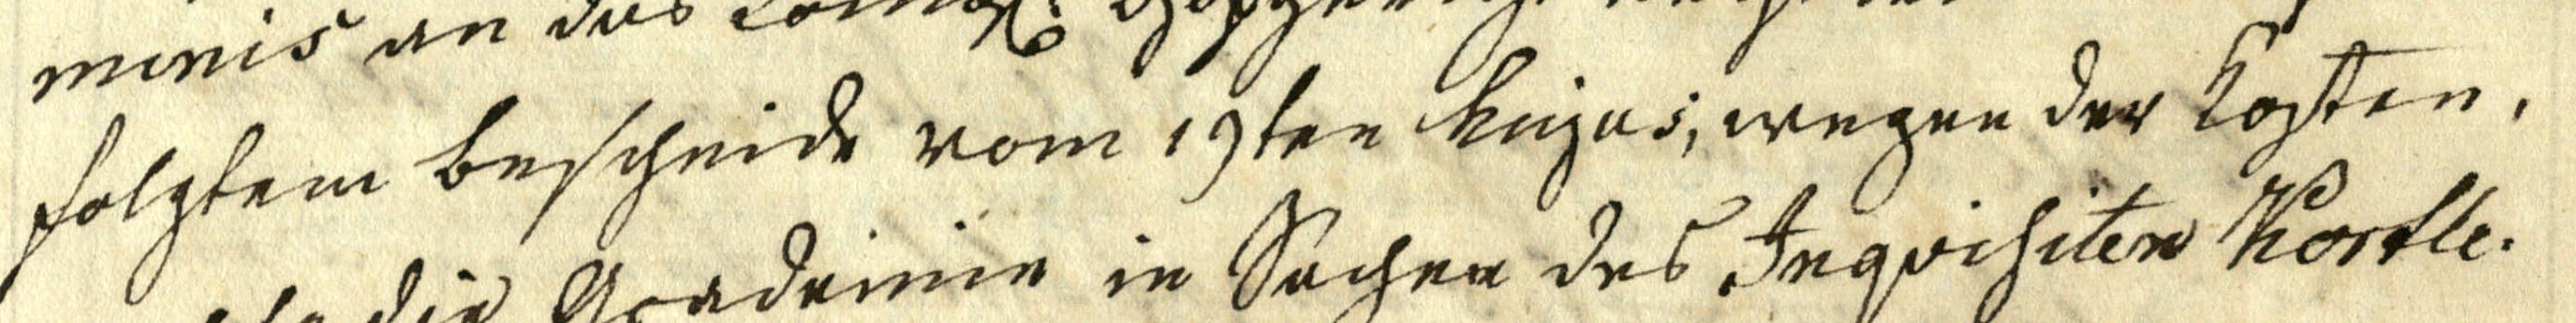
folgtem Bescheide vom 19ten hujus, wegen der Kosten,
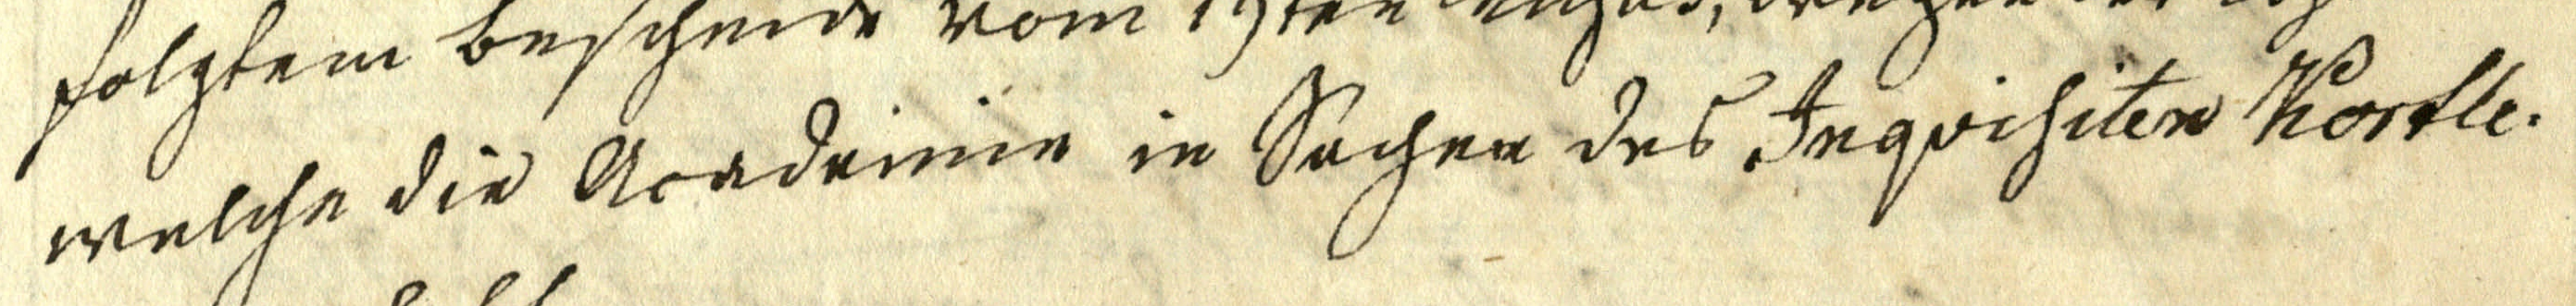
welche die Academie in Sachen des Inquisiten Kortle¬
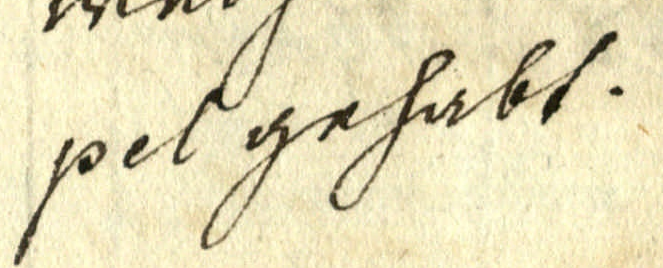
pel gehabt.
